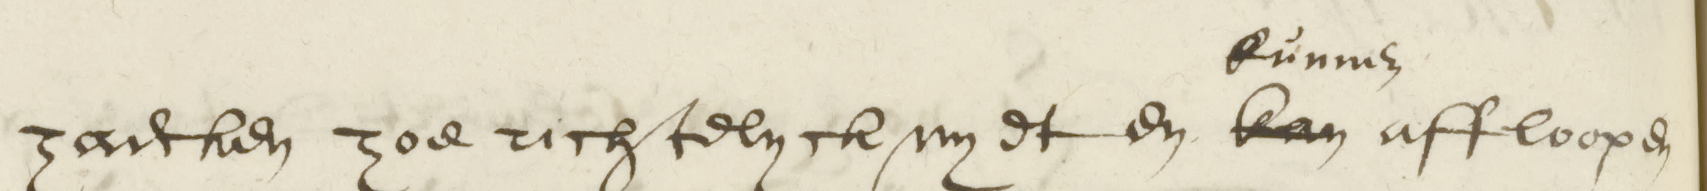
zaecken zoe richtelyck nyet en kan kunnen affloopen
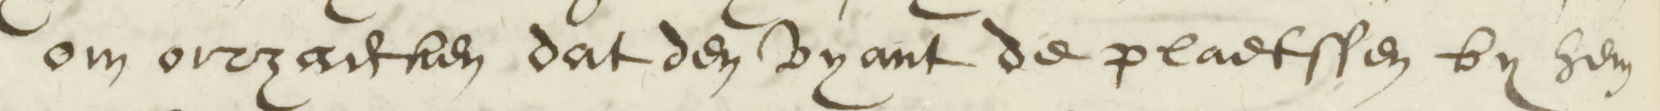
om oirzaecken dat den vyant de plaetssen by hem
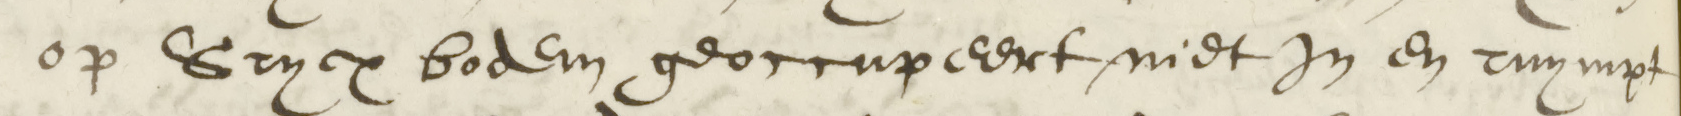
op Srycx bodem geoccupeert niet In en ruympt
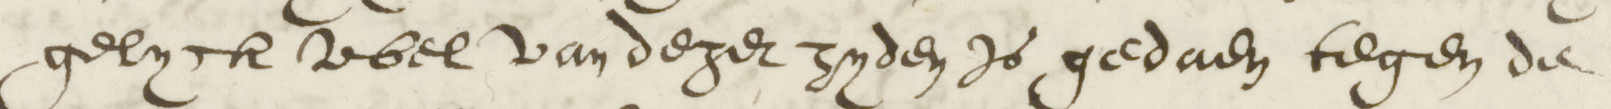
gelyck wel van dezer zyden Is gedaen tegen de
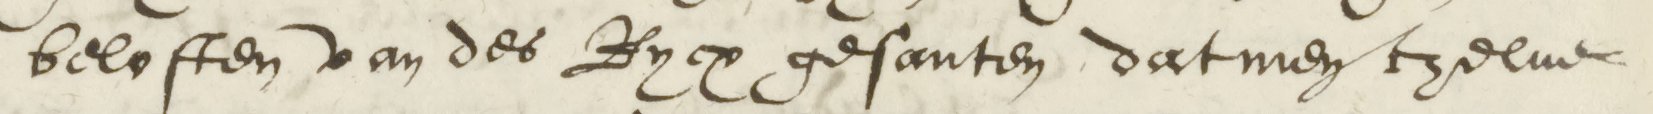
beloften van des Rycx gesanten dat men tzelve
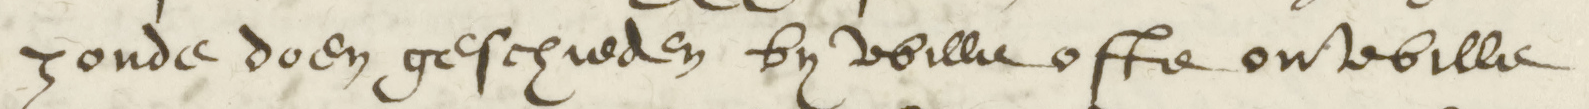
zoude doen geschieden by wille ofte onwille
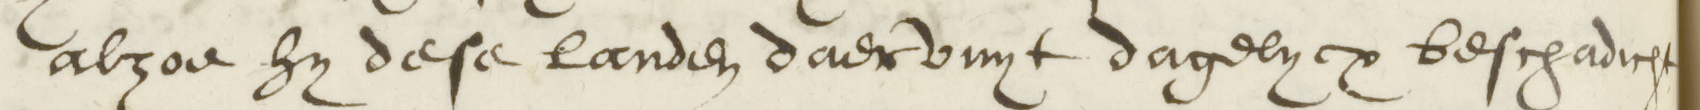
alzoe hy dese landen daervuyt dagelycx beschadicht
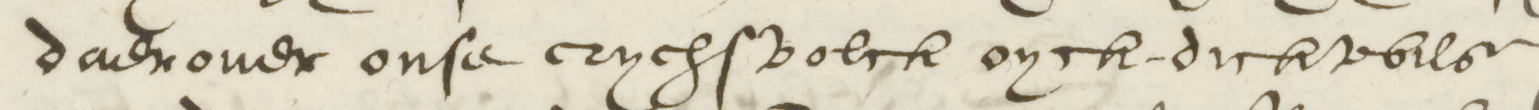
daerouer onse crychsvolck oyck dickwils
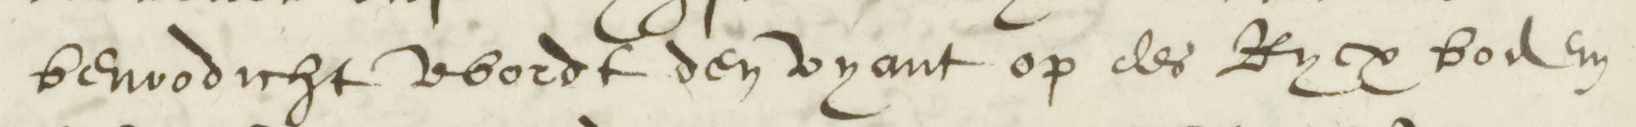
benoodicht wordt den vyant op des Rycx bodem
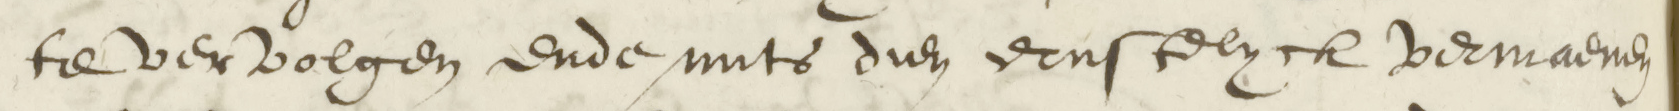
te vervolgen ende mits dien ernstelyck vermaenen
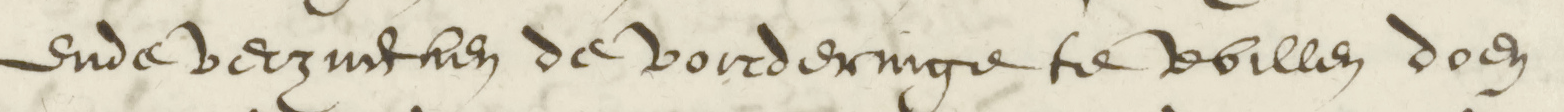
ende verzuecken de voirderinge te willen doen
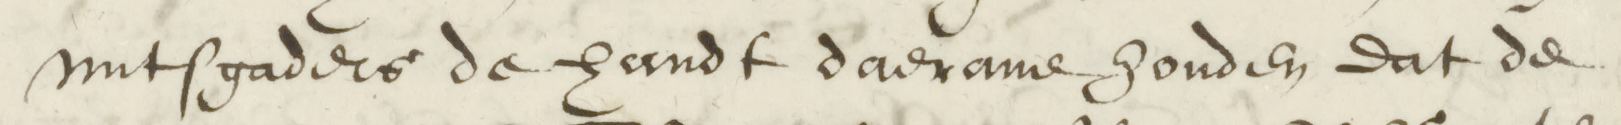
mitsgaders de handt daerane houden dat de
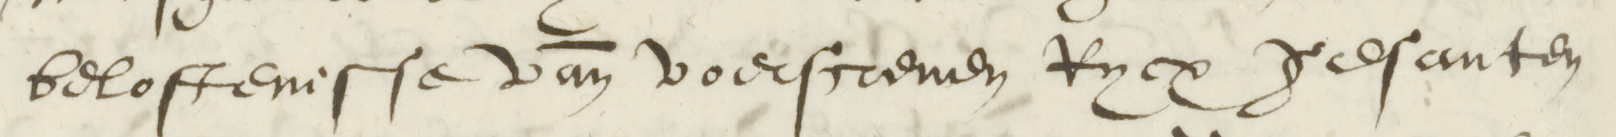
beloftenisse van voerscreuen Rycx gesanten
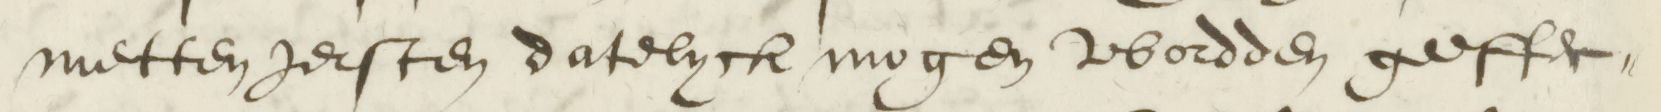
metten Iersten datelyck mogen wordden geeffec,,
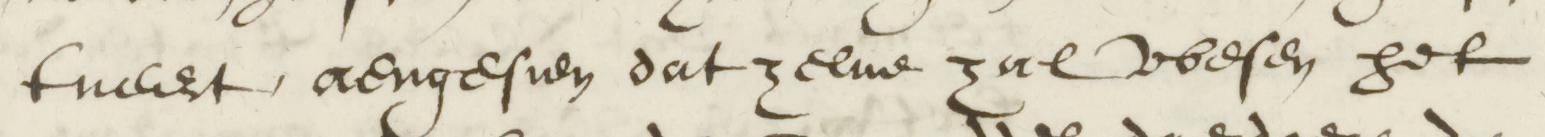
tueert, aengesien dat zelue zal wesen het
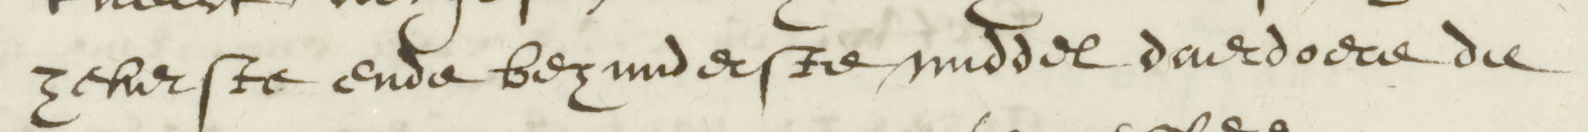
zekerste ende bezunderste middel daerdoere de
